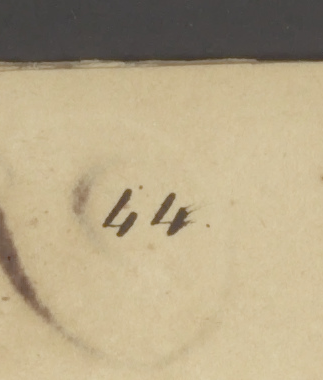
44.
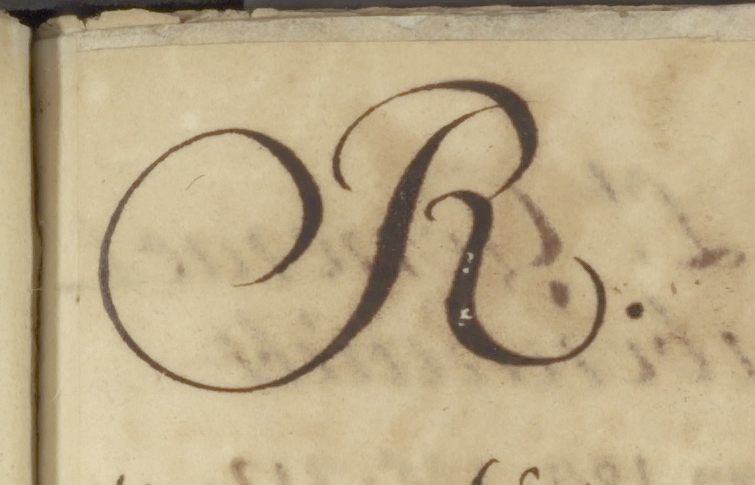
R.
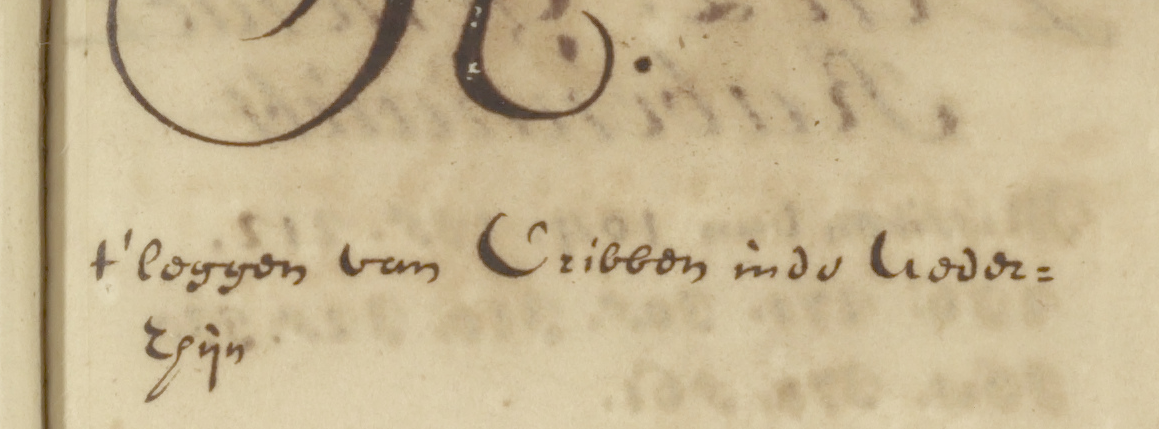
t'leggen van Cribben inde Neder=
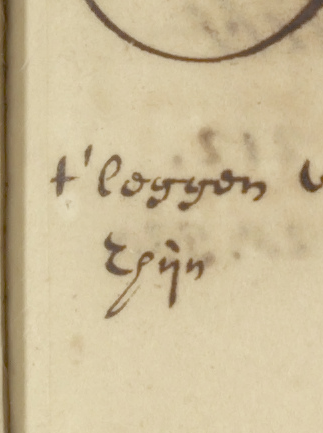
rhijn
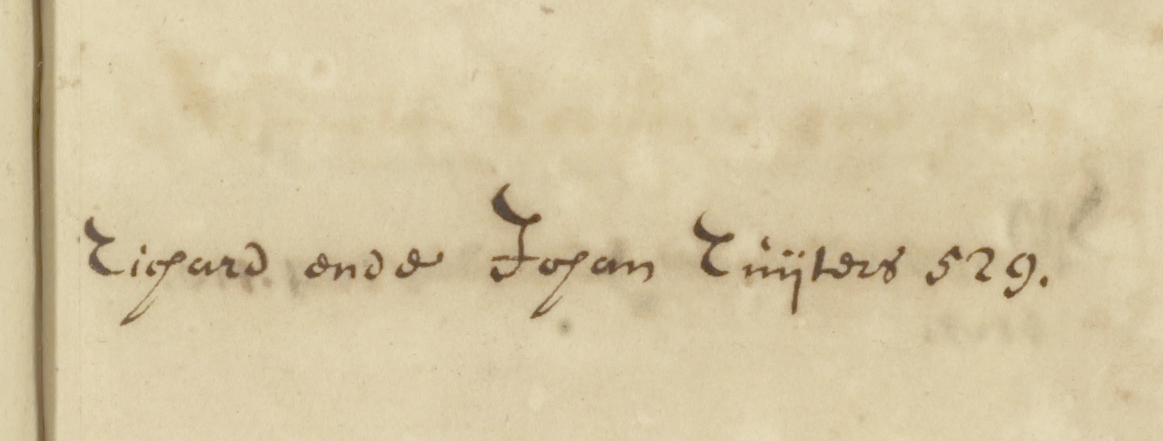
Richard ende Johan Ruijters 529.
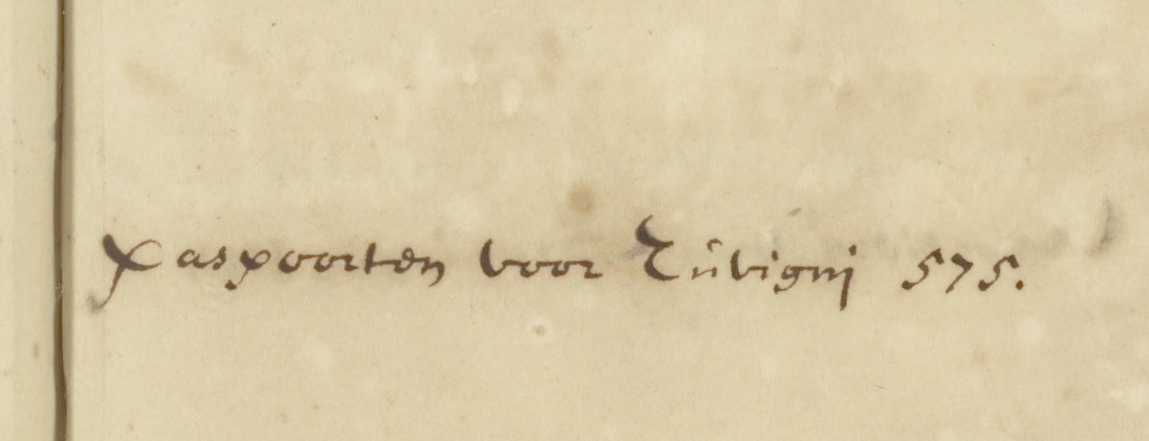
Paspoorten voor Ruvigni 575.
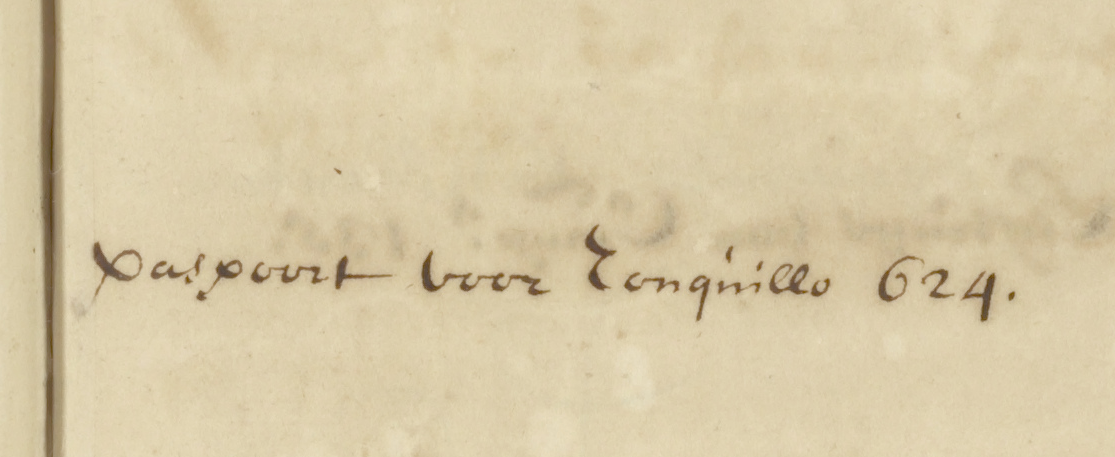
Paspoort voor Ronquillo 624.
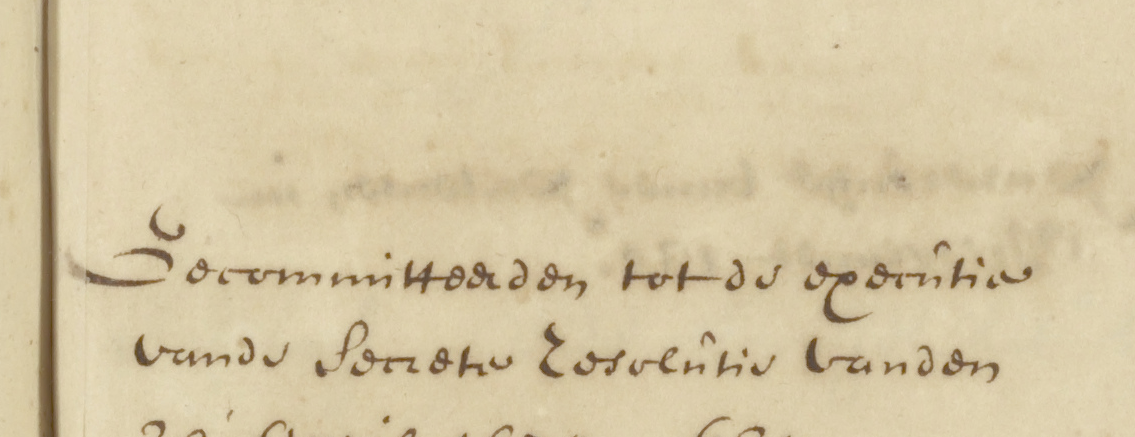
Gecommitteerden tot de executie
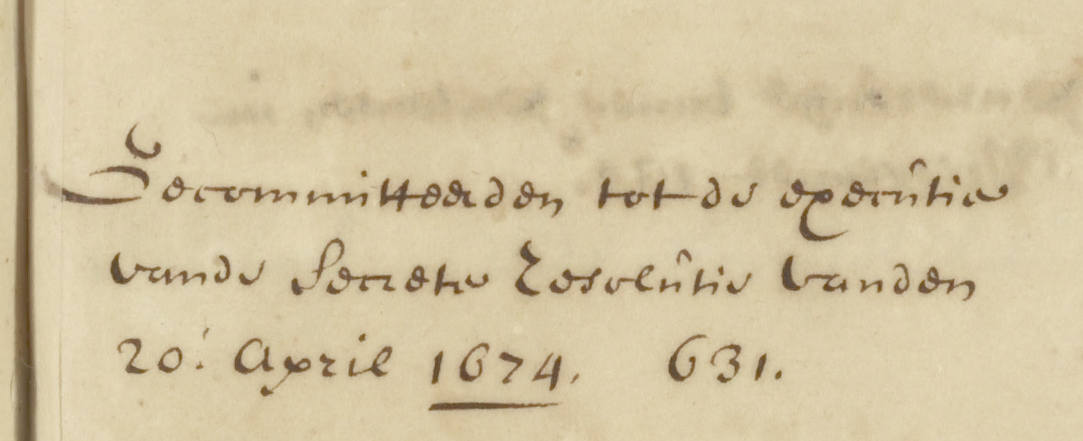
vande Secrete Resolutie vanden
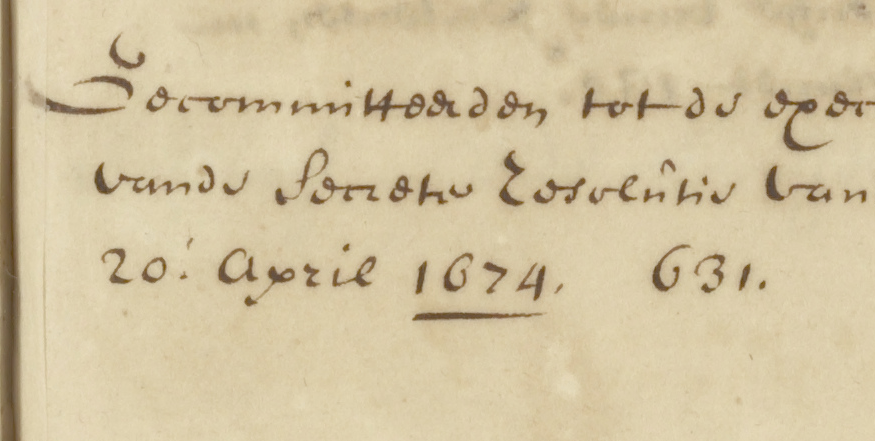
20: April 1674. 631.
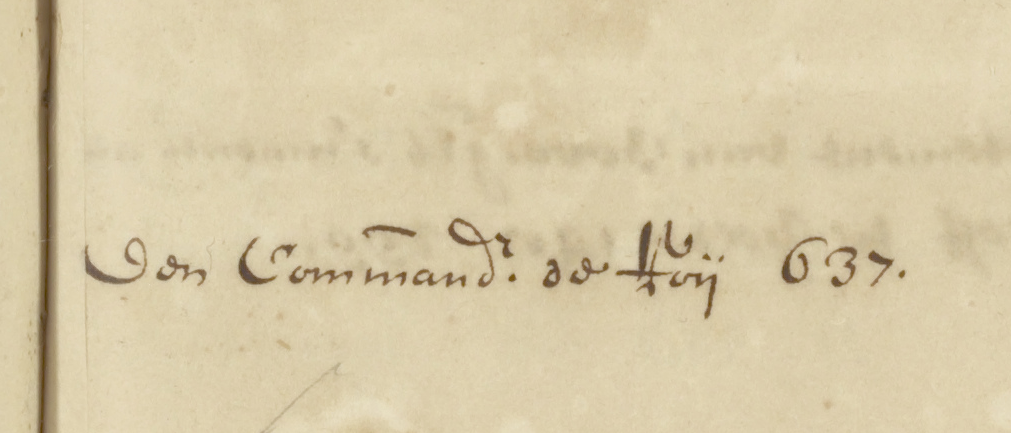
Den Commandr. de Roij 637.
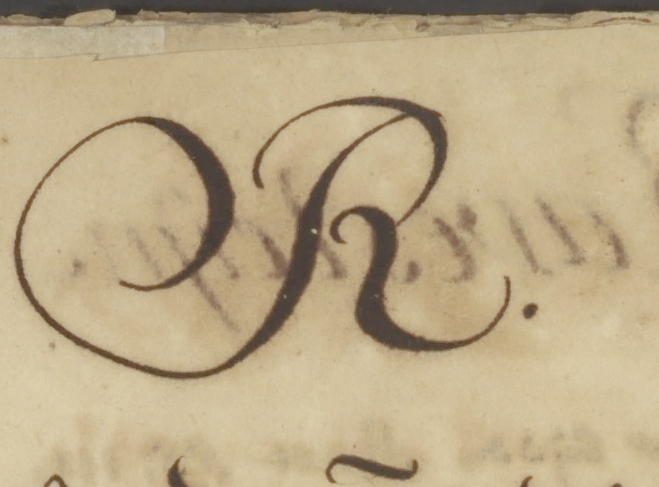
R.
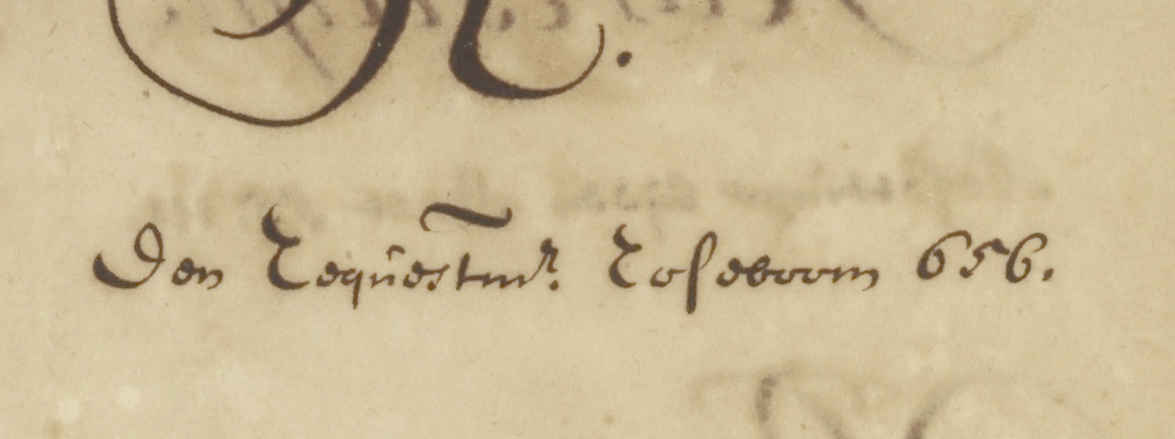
Den Requestmr. Roseboom 656.
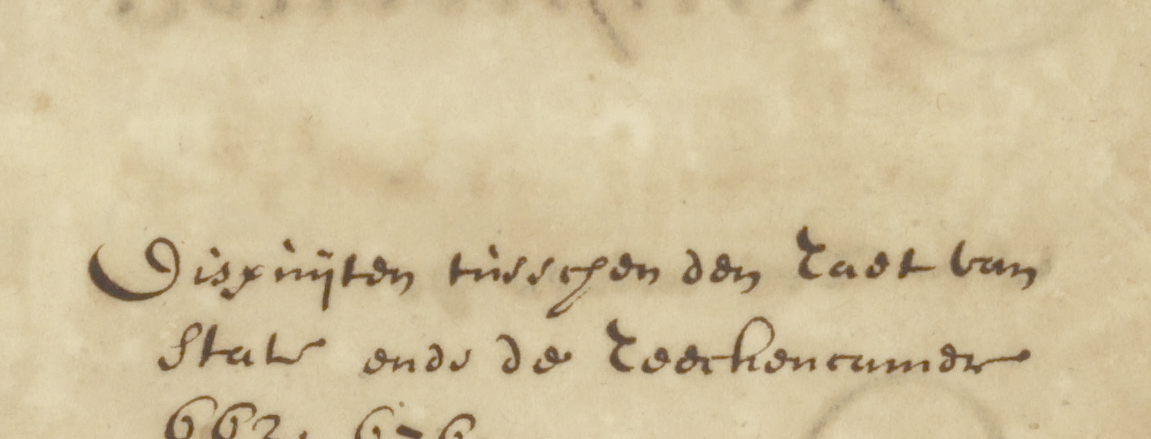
Dispuijten tusschen den Raet van
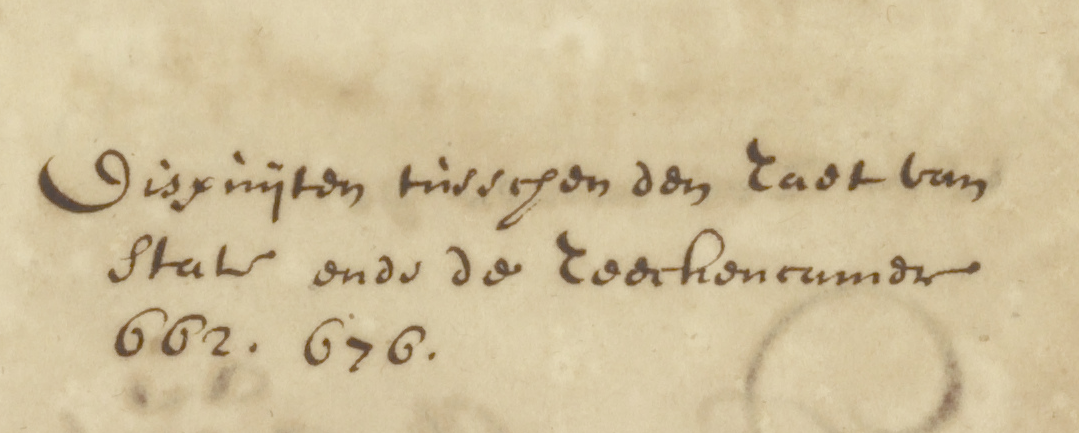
State ende de Reeckencamer
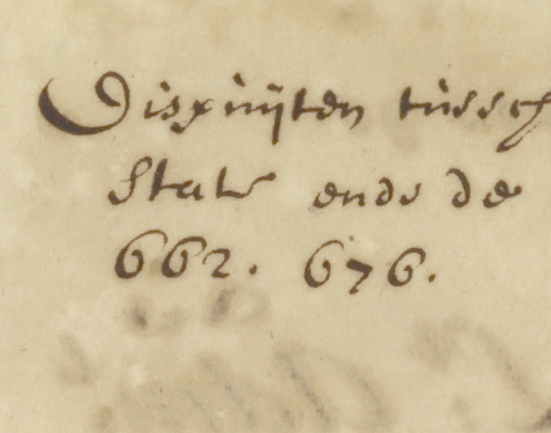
662. 676.
